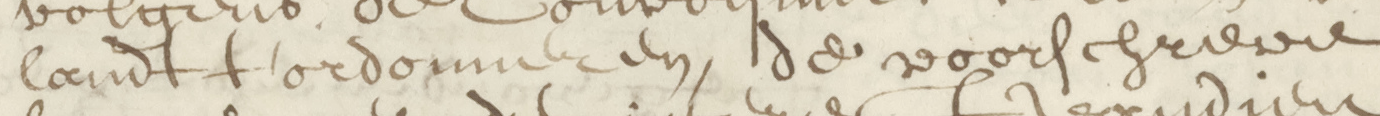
landt t'ordonneren, de voorschreve
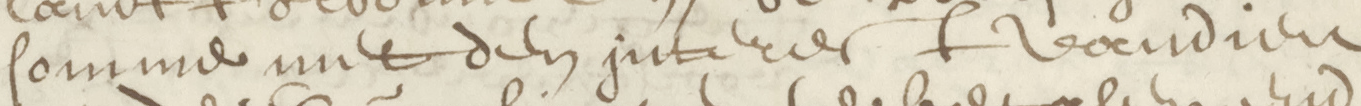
somme met den interest vandien
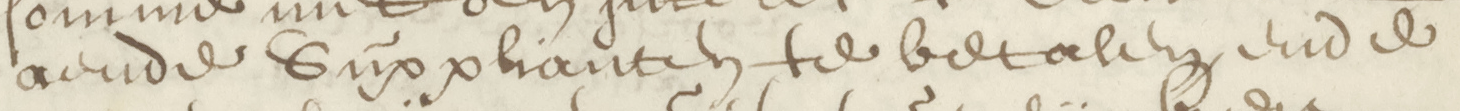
aende Supplianten te betalen, ende
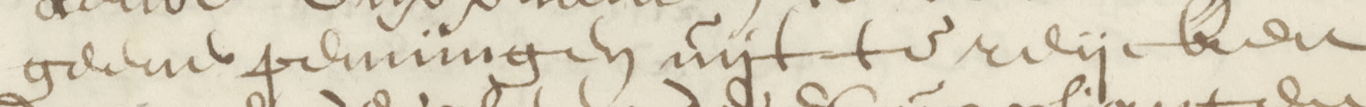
geene penningen uijt te reijcken
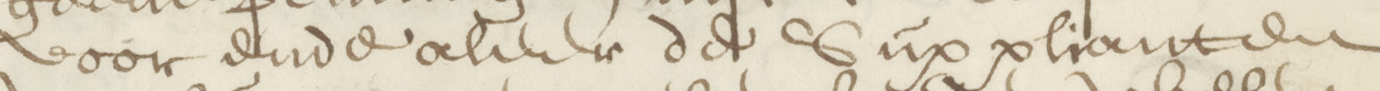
voor ende aleer de supplianten
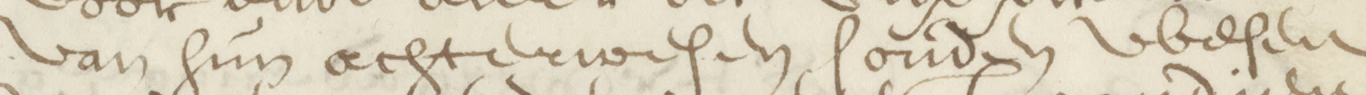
van hun achterwesen souden wesen
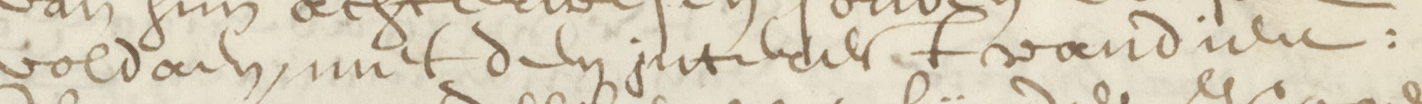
voldaen, met den interest vandien:
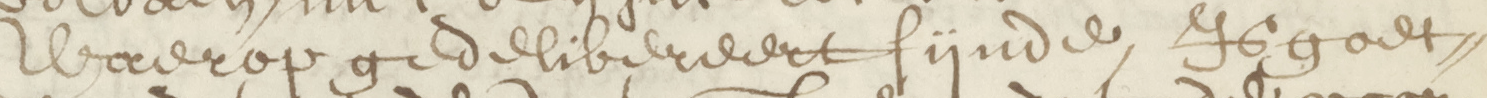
Waerop gedelibereert sijnde, is goet„
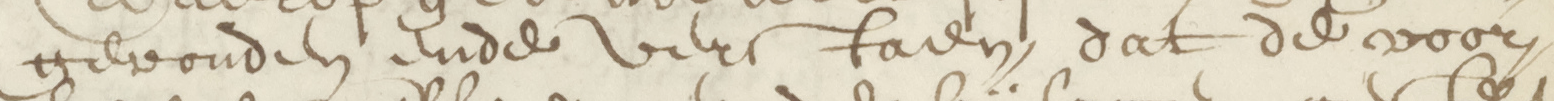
gevonden ende verstaen, dat de voor„
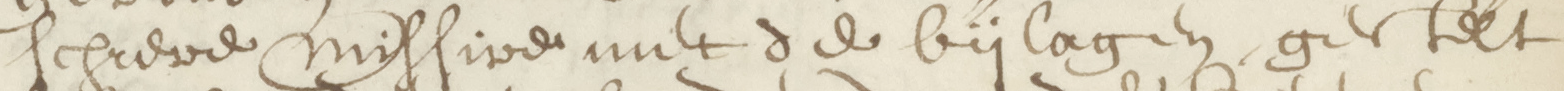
schreve missive met de bijlagen, gestelt
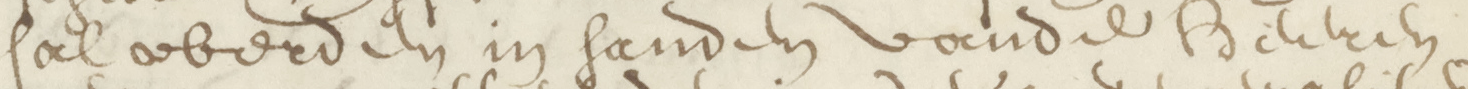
sal werden in handen vande heeren
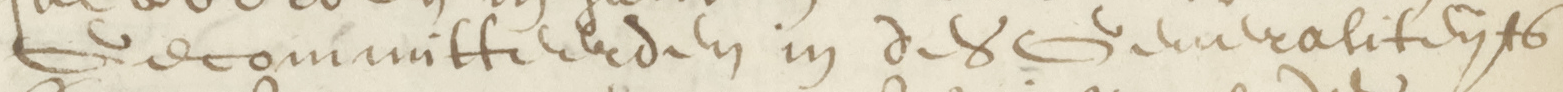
Gecommitteerden in des Generaliteijts
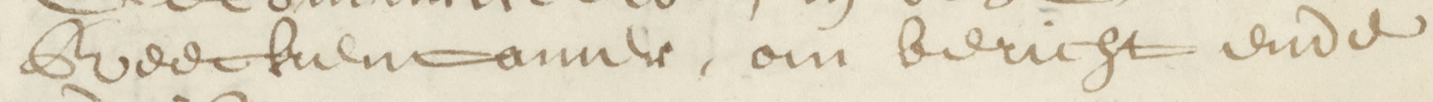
Reeckencamer, om bericht ende
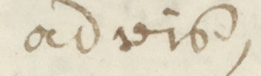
advis.
